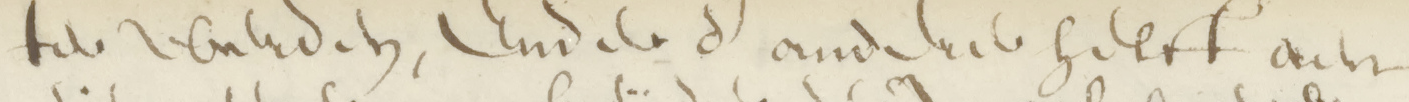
te werden, ende d'andere helft aen
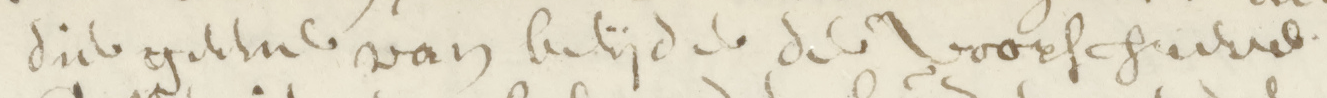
die geene van beijde de voorschreve
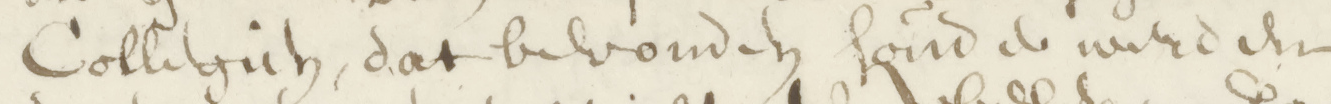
Collegien, dat bevonden soude werden
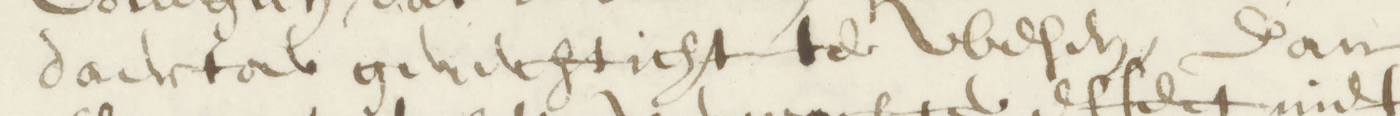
daertoe gerechticht te wesen. Dan
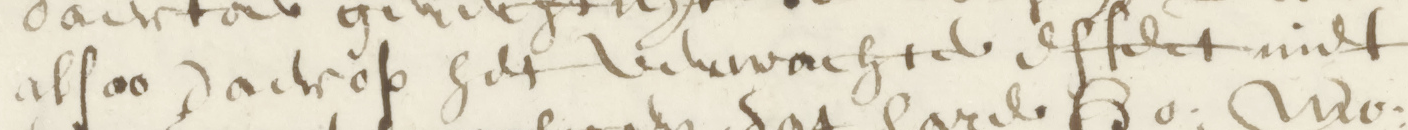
alsoo daerop het verwachte effect niet
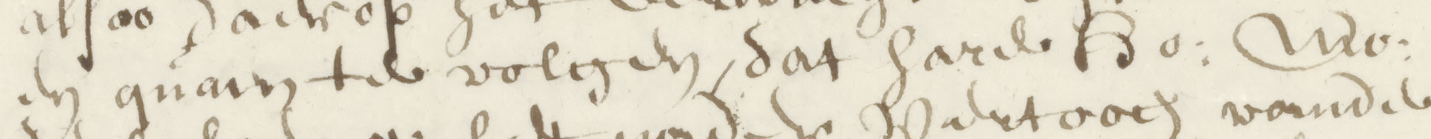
en quam te volgen, dat hare Ho:Mo:
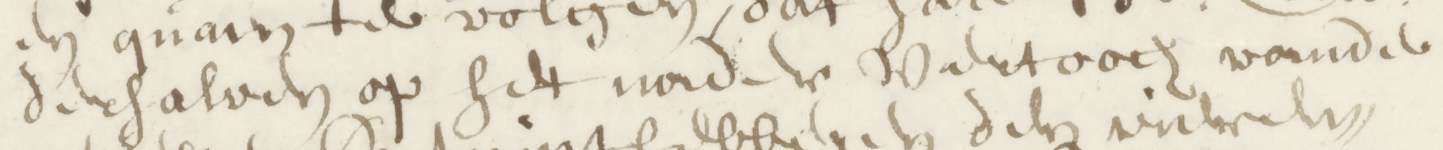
derhalven op het nader Vertooch vande
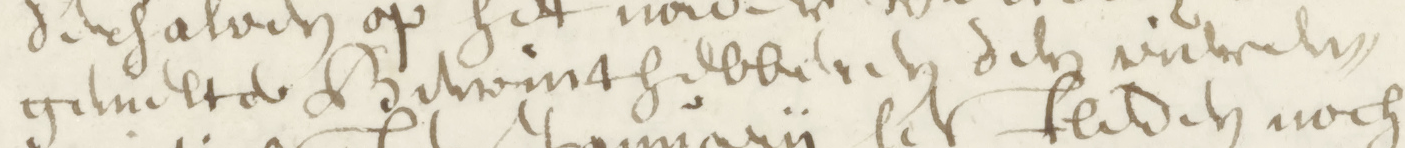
gemelte Bewinthebberen den vieren,,
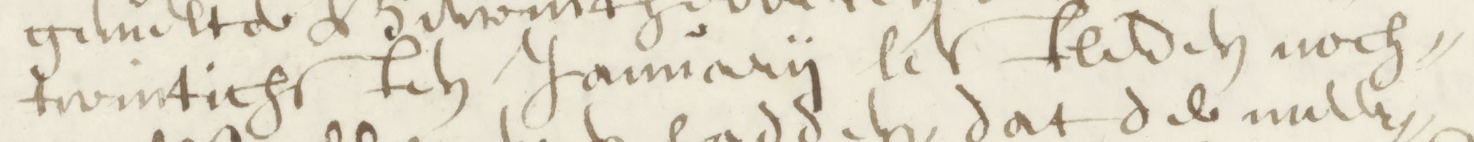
twintichsten Januarij lestleden noch„
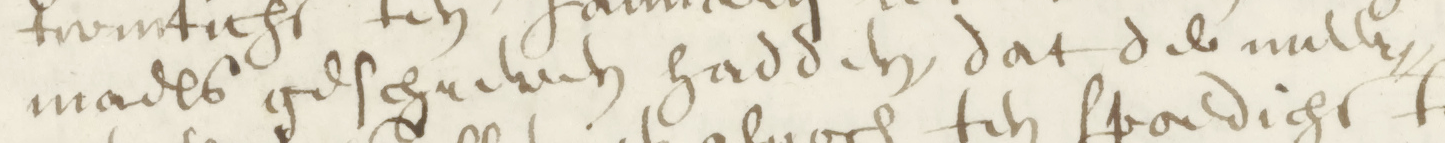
maels geschreven hadden, dat de meer„
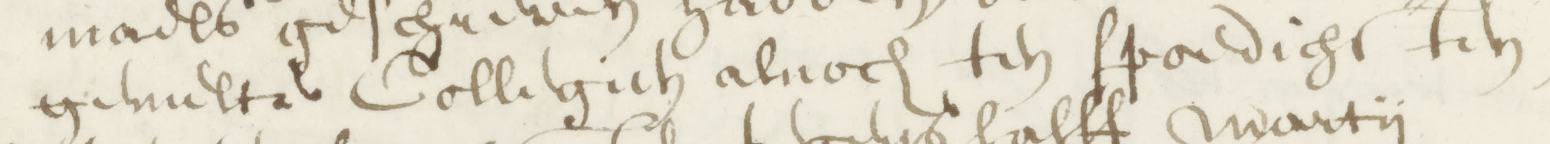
gemelte Collegien alnoch ten spoedichtsten
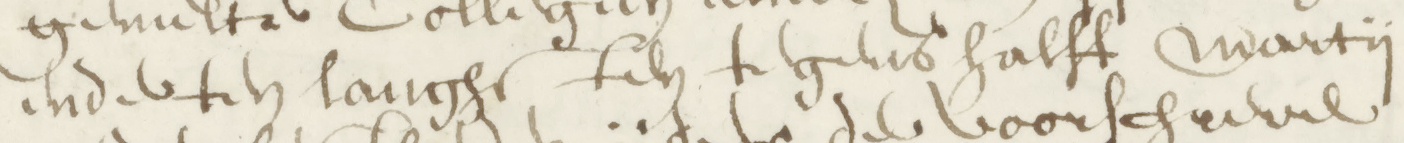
ende ten langhsten tegens halff Martij
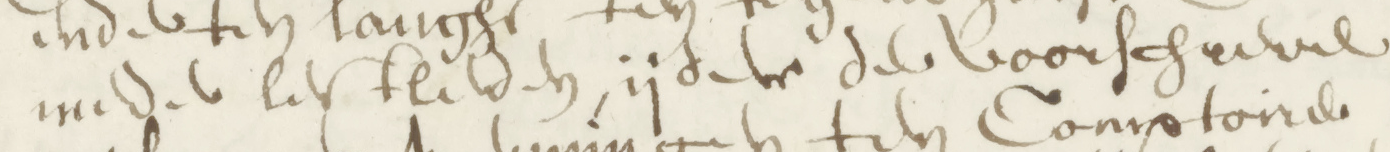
mede lestleden, ijder de voorschreve
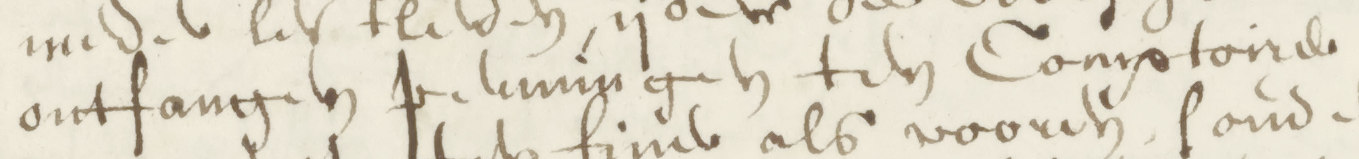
ontfangen penningen ten Comptoire
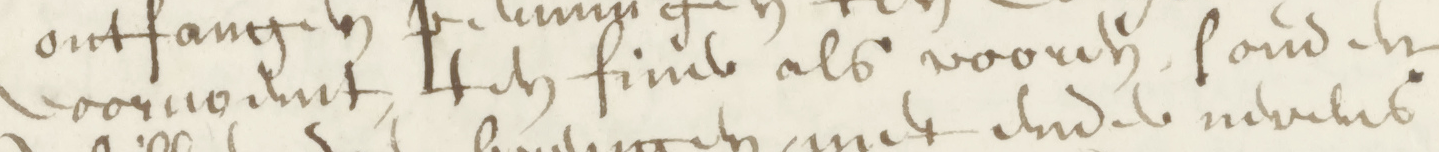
voornoemt ten fine als vooren souden
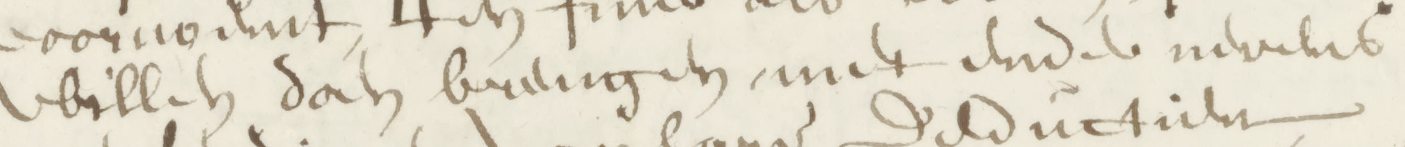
willen doen brengen, met ende nevens
